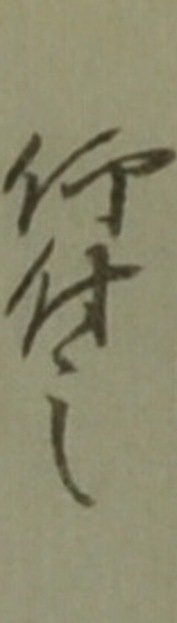仰付之
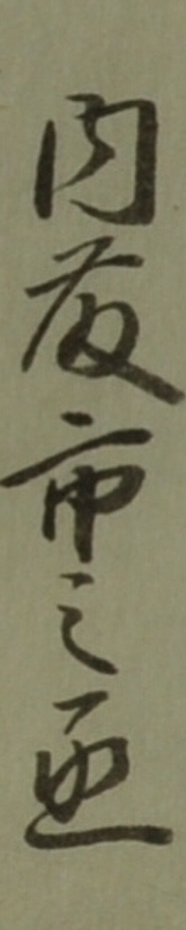内藤市之丞
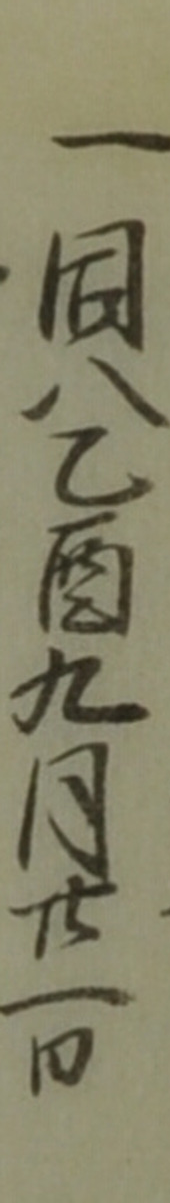一同八乙酉九月廿一日
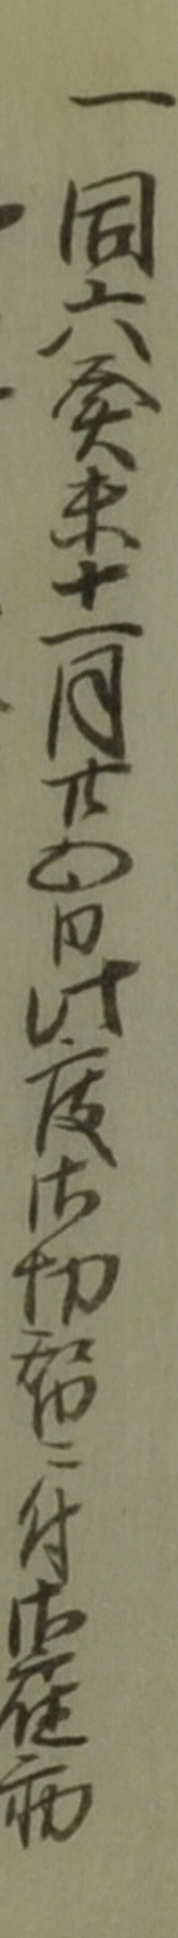一同六癸未十一月廿五日此度御切替ニ付御雇勤
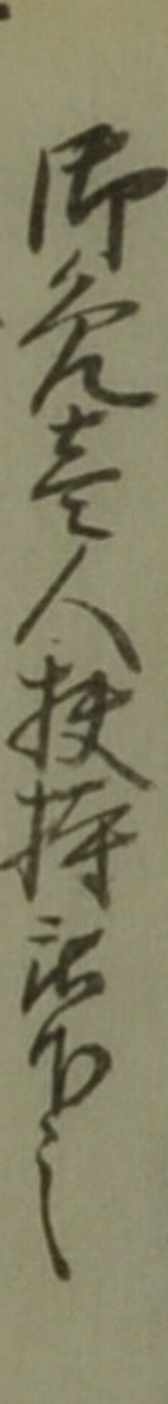御免壱人扶持被下之
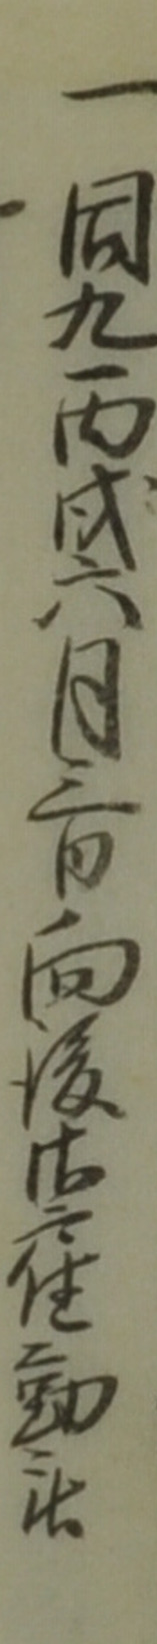一同九丙戌六月三日向後御雇勤被
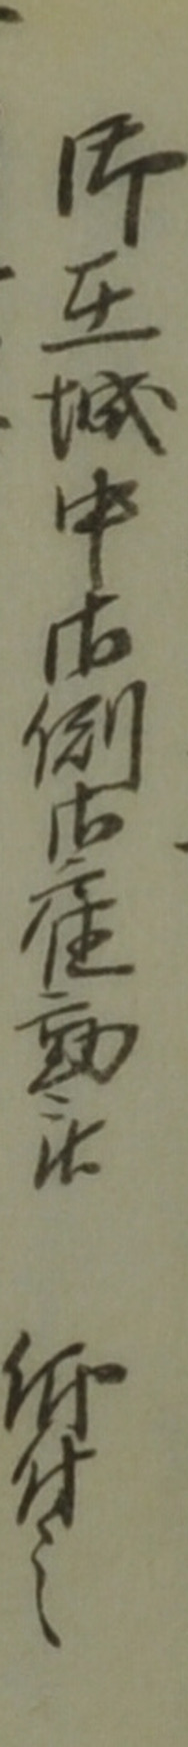御在城中御側御雇勤被仰付之
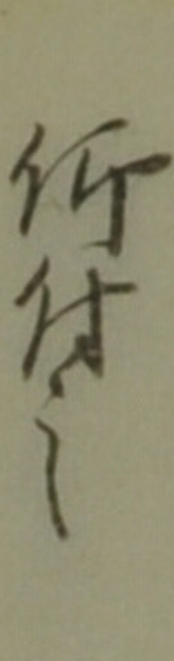仰付之
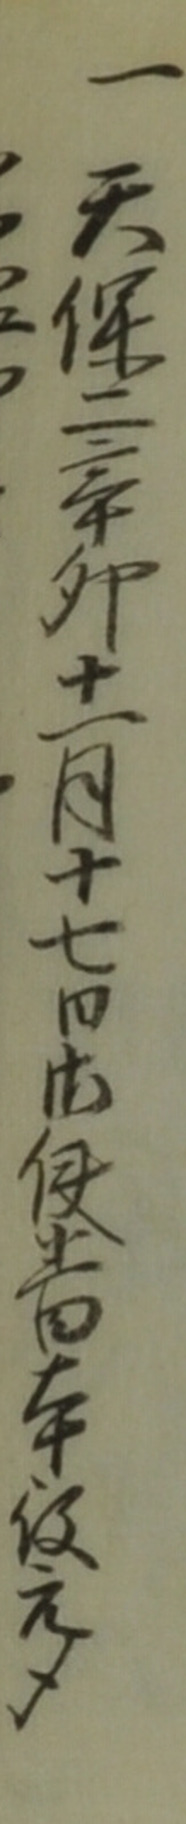一同天保二辛卯十一月十七日御使番本役元〆
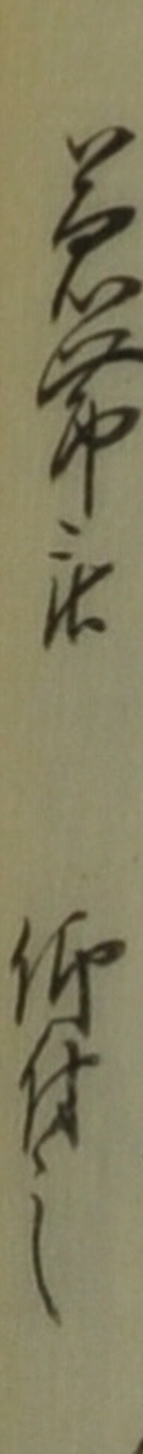兼帯被仰付之
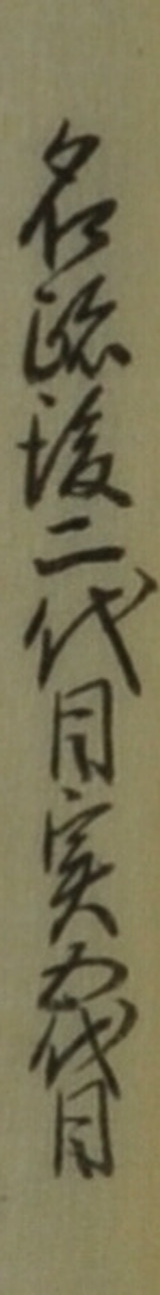名跡後二代目実五代目
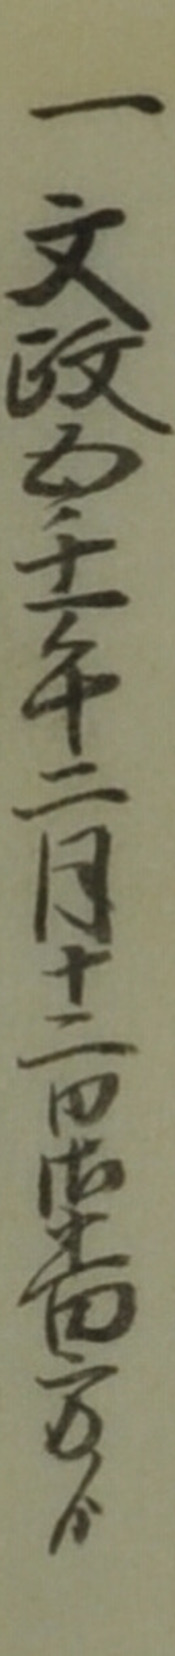一文政五壬午二月十二日御番方ゟ
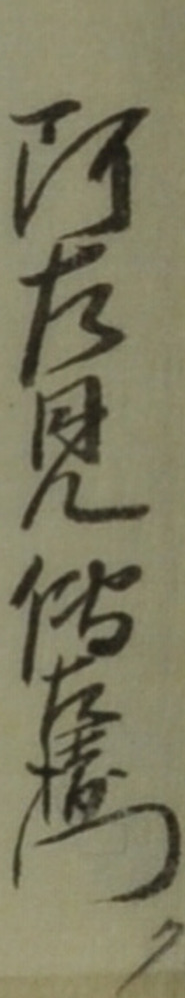阿左見伝左衛門
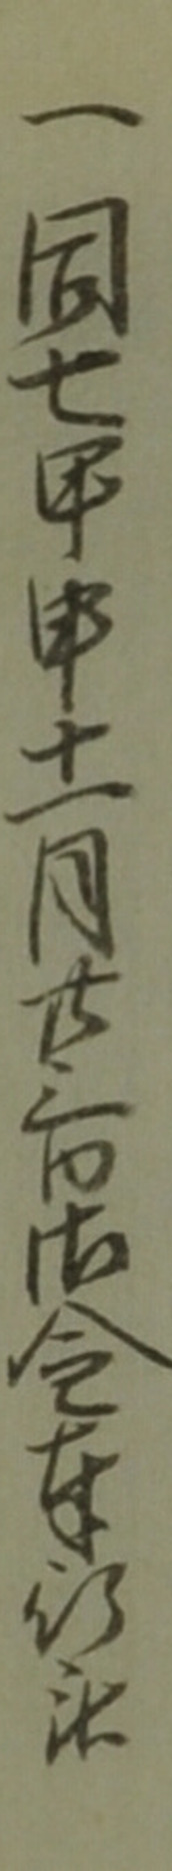一同七甲申十一月廿三日御金奉行被
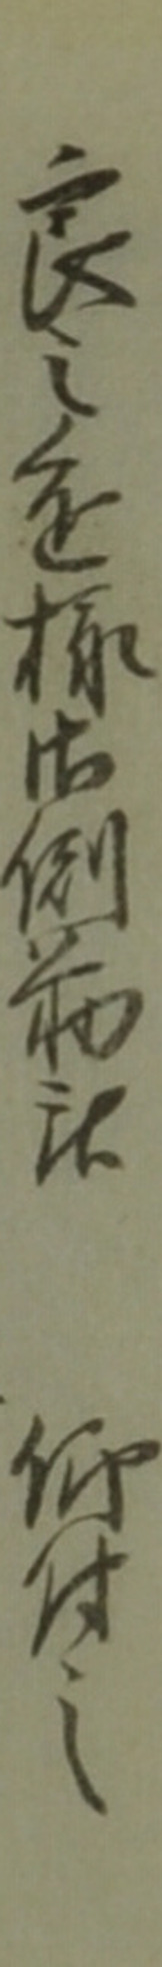良之進様御側勤被仰付之
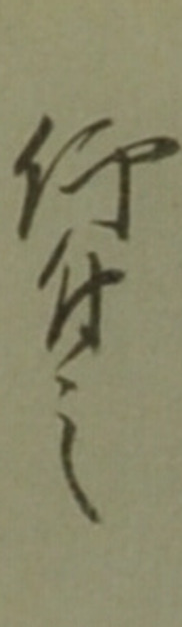仰付之
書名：諸御役代々録（五）
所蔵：伊那市立高遠町図書館・合同会社AMANE
